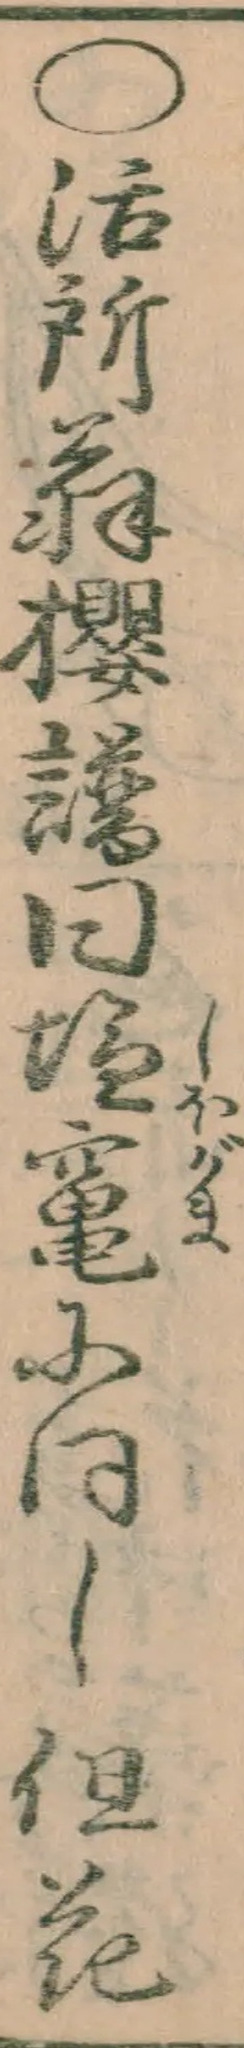○活所翁桜譜曰塩竃に同し但花
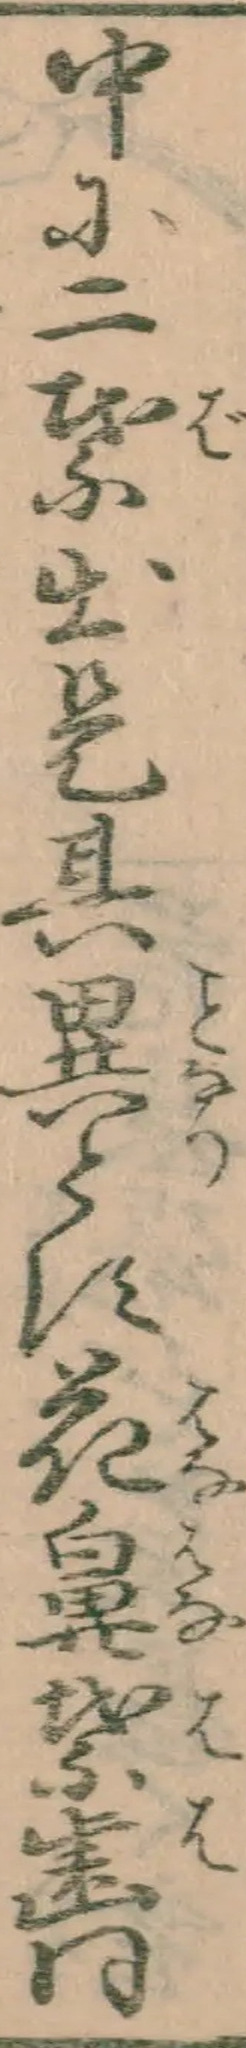中に二葉出是其異とす花鼻葉歯同
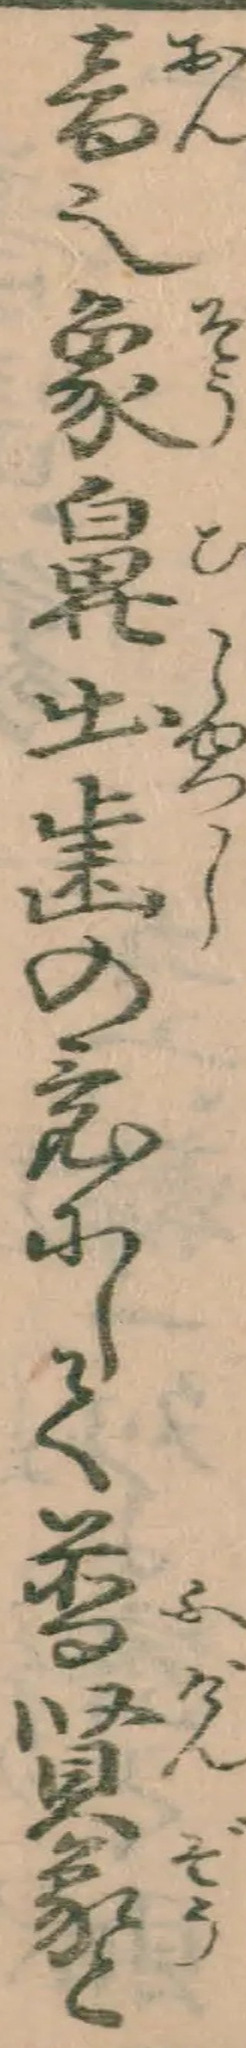音也象鼻出歯の意にして普賢象と
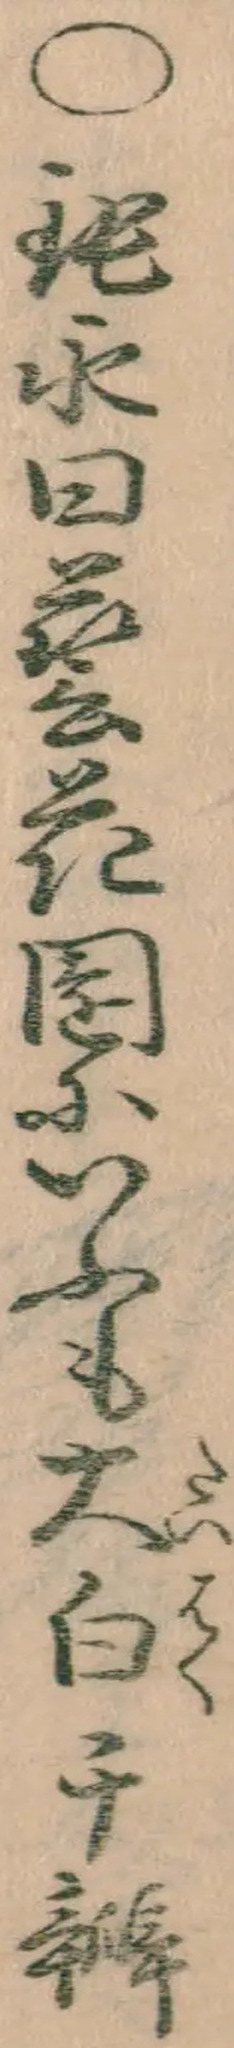○鈍永曰芸花園にいふも大白千弁
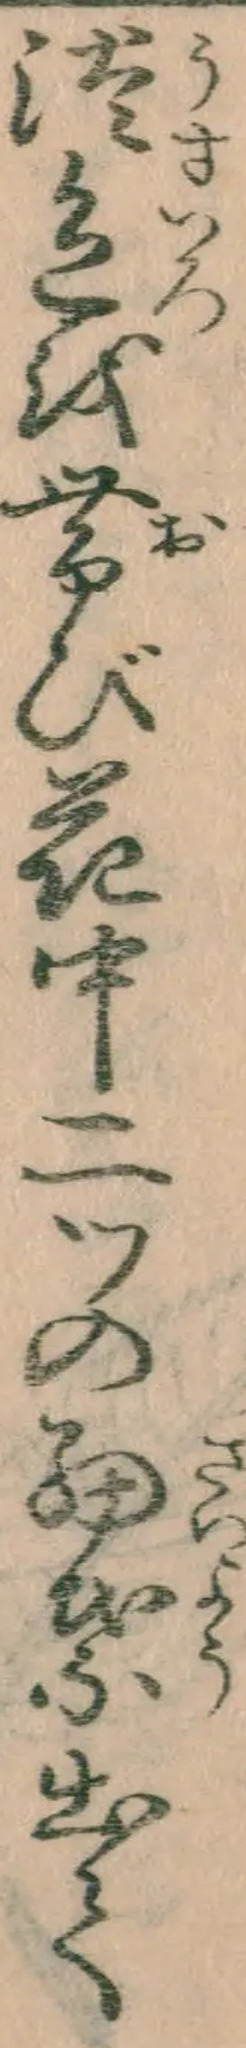淡色を帯び花中二ツの細葉出て
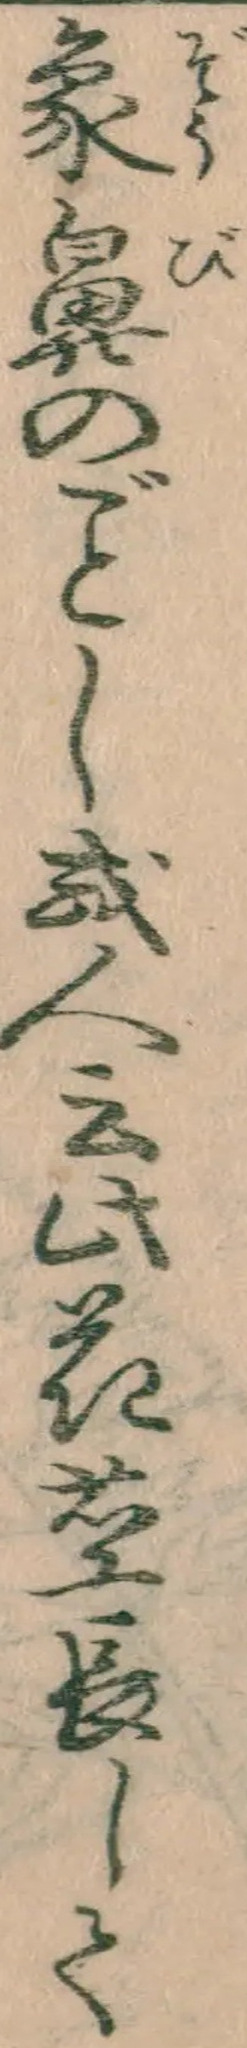象鼻のごとし或人云此花茎長して
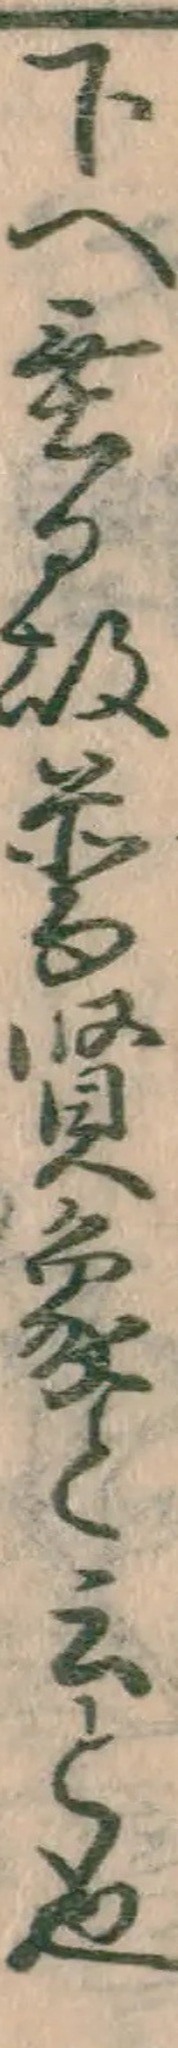下へ垂る故普賢象と云と也

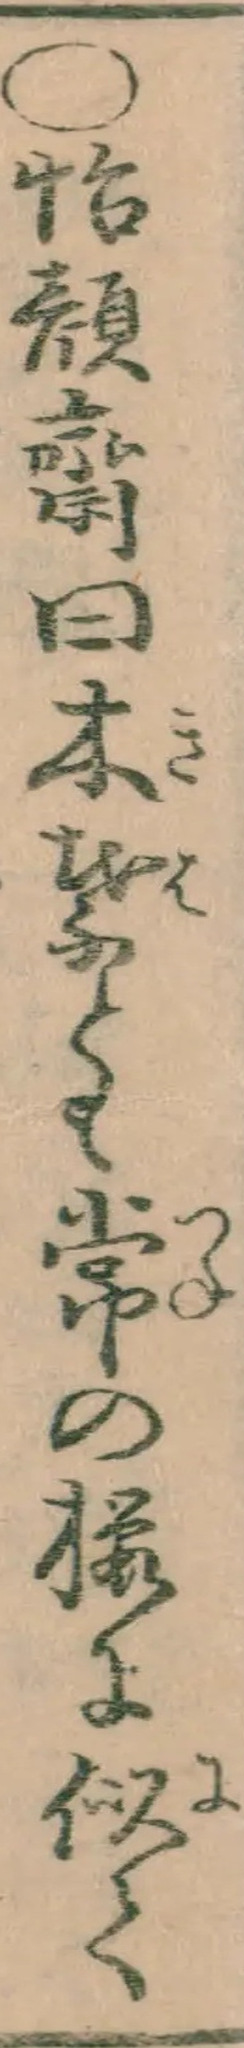○怡顔斎曰木葉とも常の桜に似て
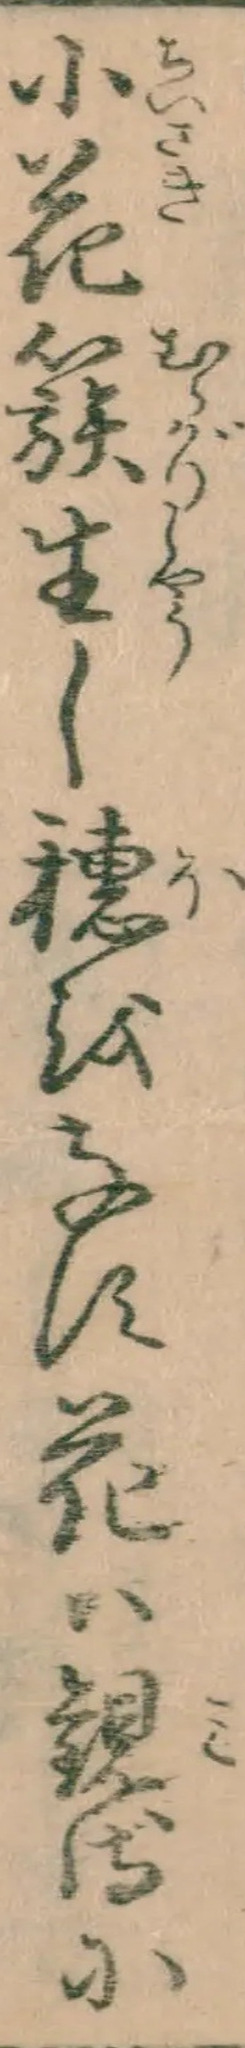小花簇生し穂をなす花は観るに
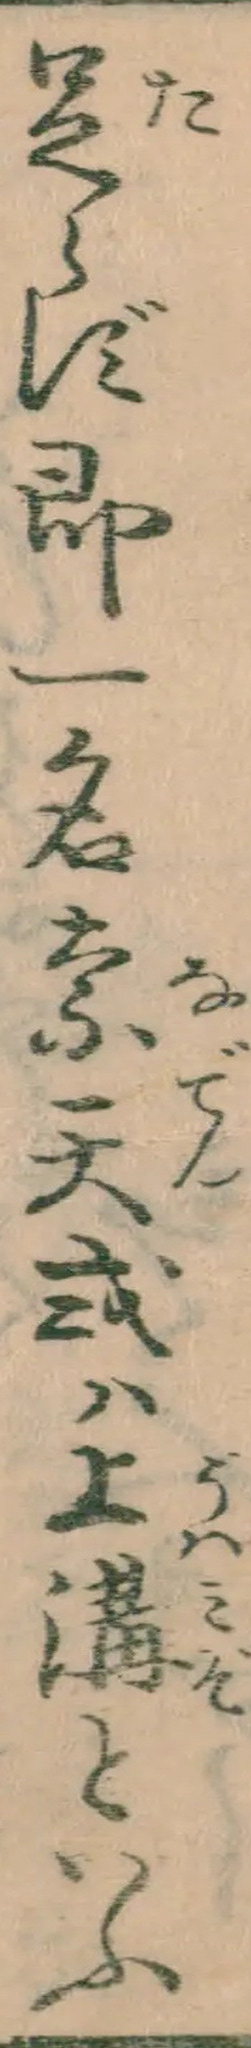足らず即一名奈天或は上溝といふ
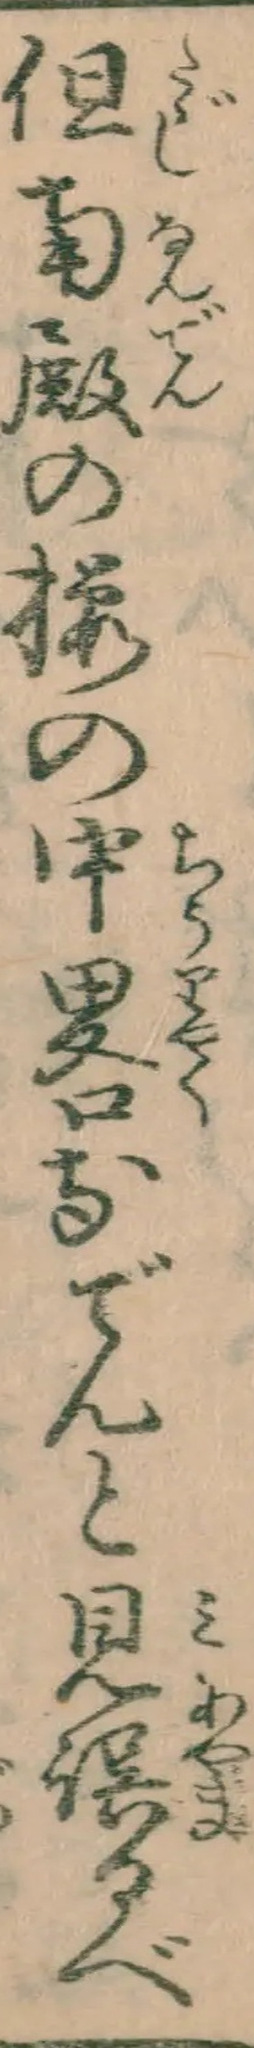但南殿の桜の中略なでんと見誤るべ
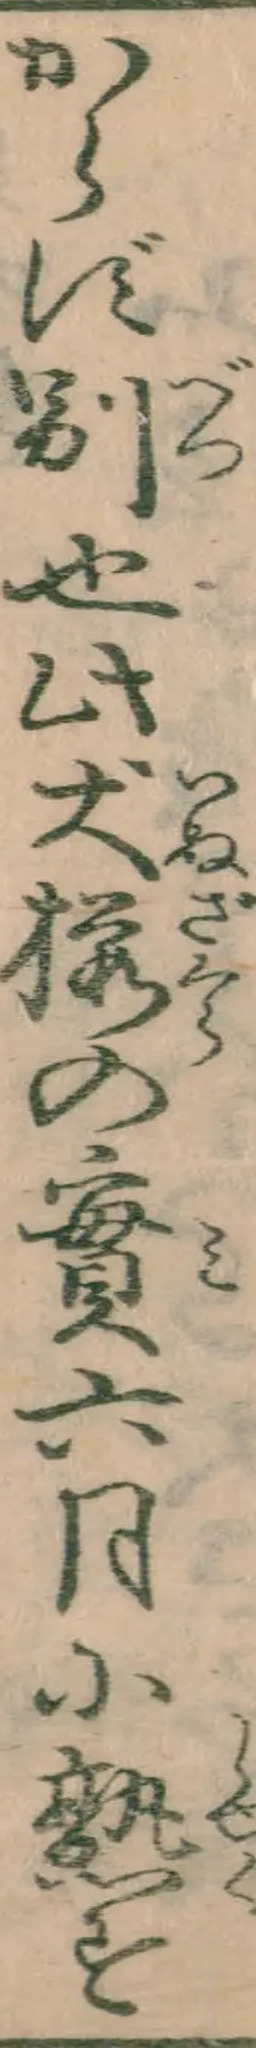からず別也此犬桜の実六月に熟す
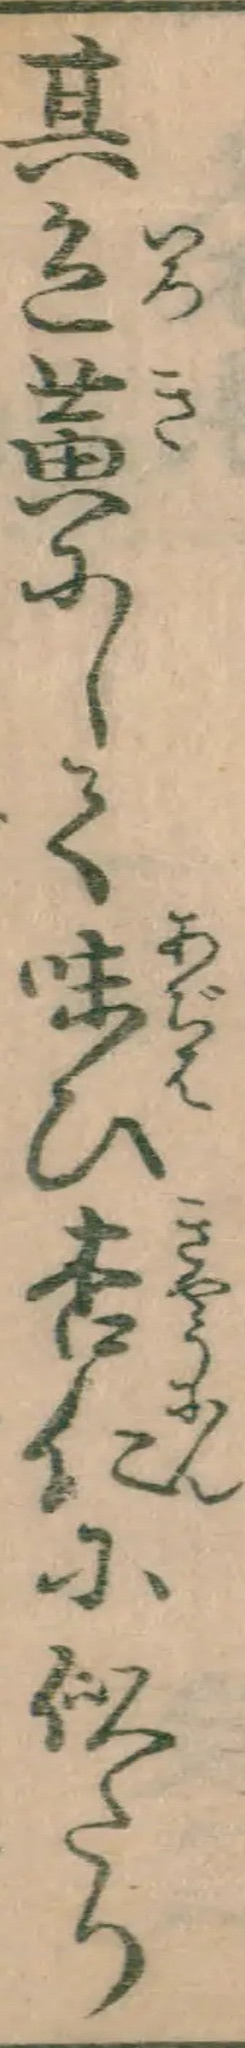其色黄にして味ひ杏仁に似たり
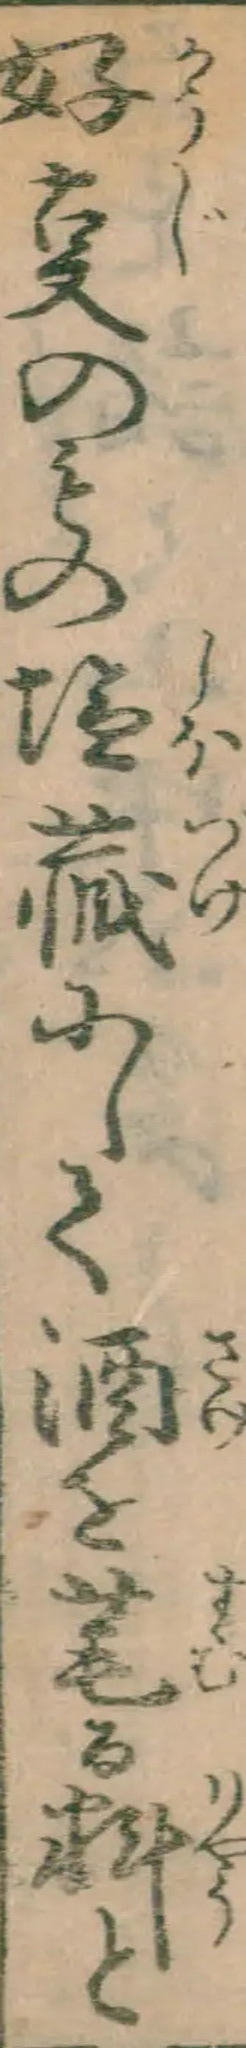好事のもの塩蔵にして酒を芼る料と

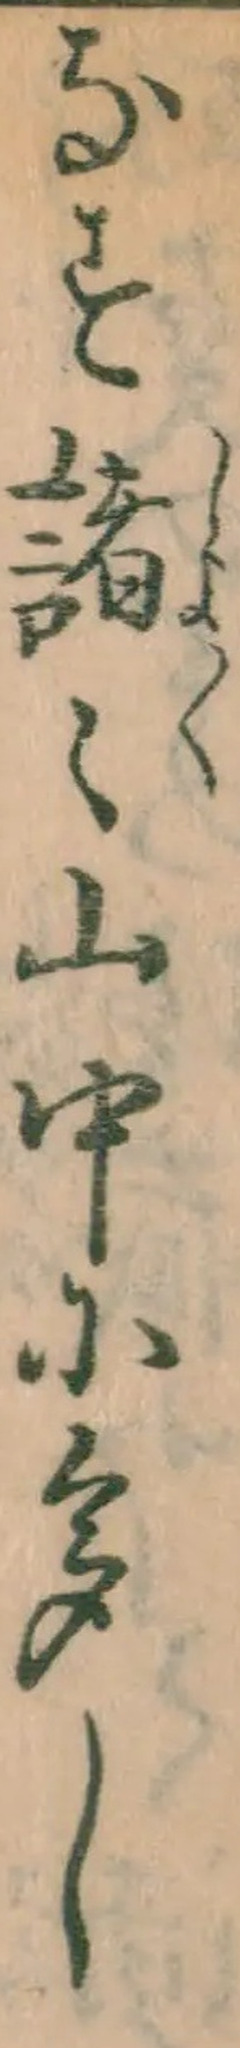なす諸々山中に多し
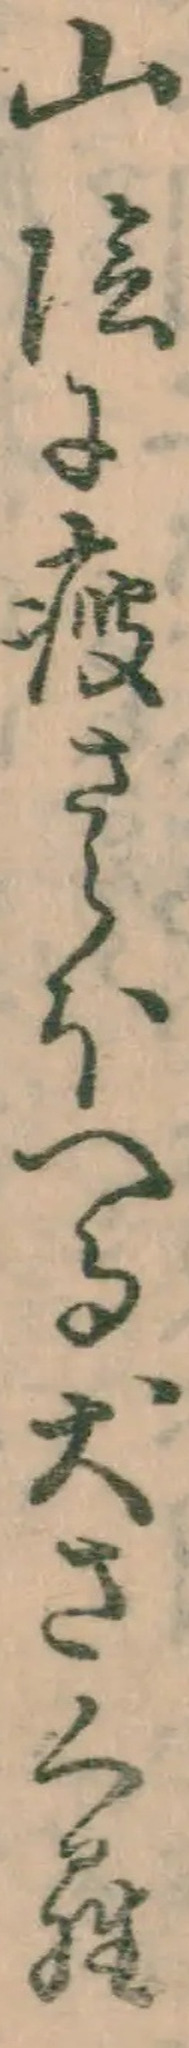山陰に痩さらほへる犬さくら
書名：怡顔齋櫻品
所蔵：国立国会図書館 National Diet Library, JAPAN
